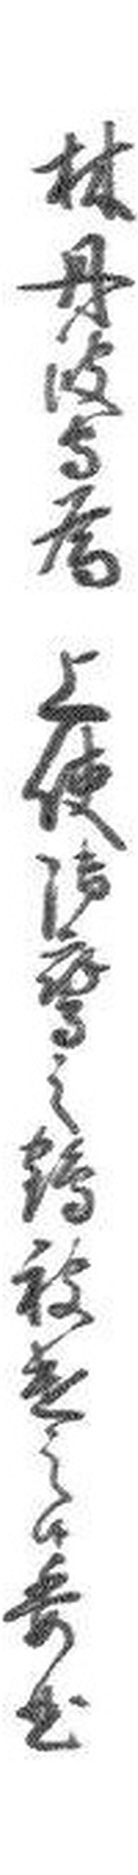林丹波守為上使御鷹之鶴被遣之候委曲
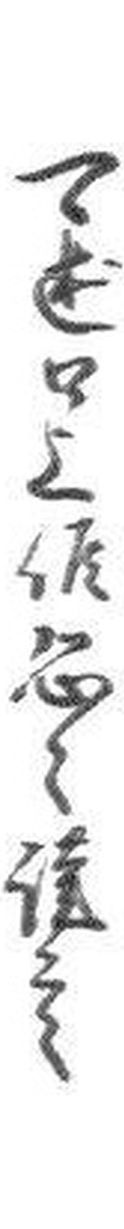可述口上候恐々謹言
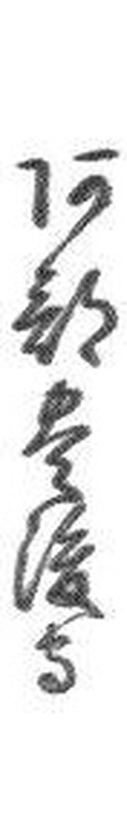阿部豊後守

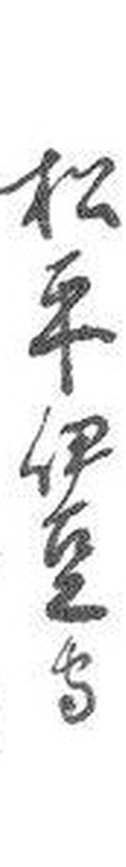松平伊豆守
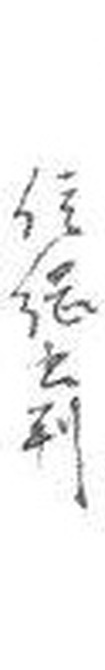信綱書判
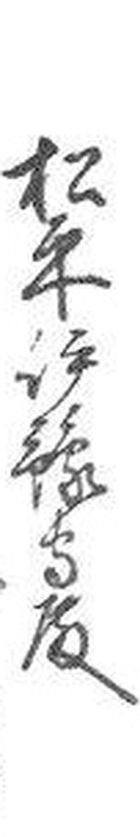松平伊予守殿
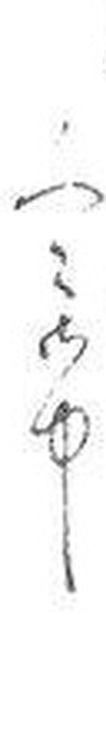人々御中
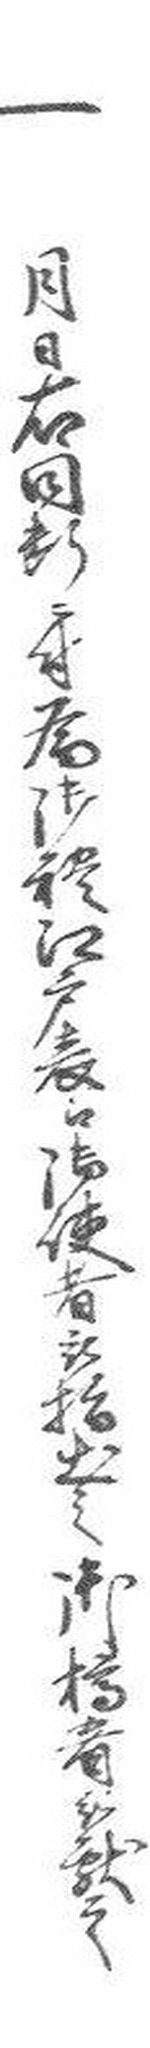一月日右同断ニ付為御礼江戸表江御使者被指出之御樽肴被献之
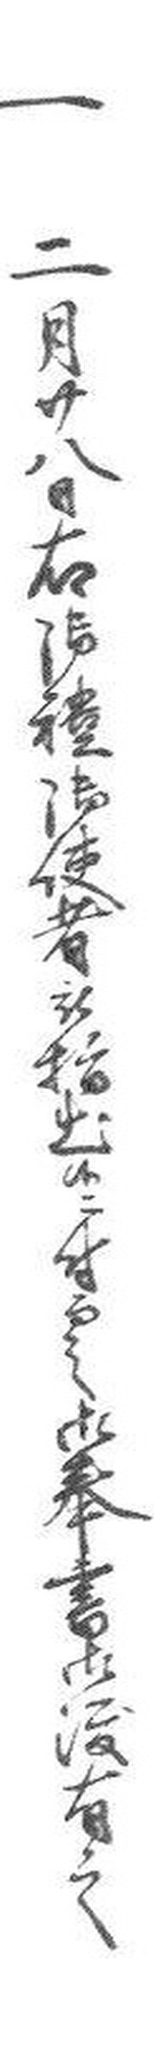一二月廿八日右御礼御使者被指出候ニ付而之御奉書御渡有之
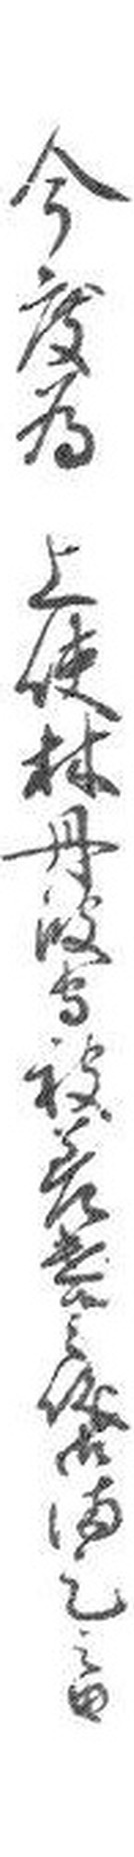今度為上使林丹波守被差遣候之儀御満足之由
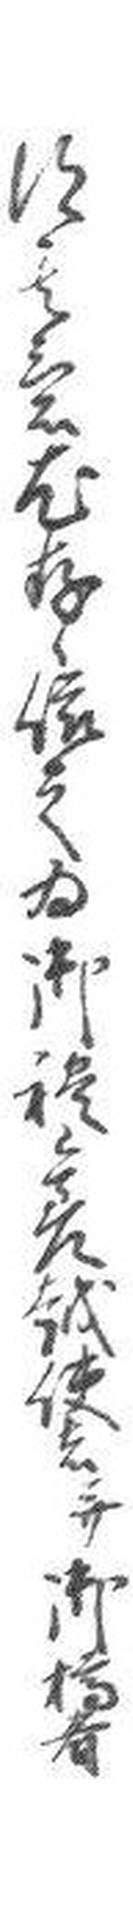得其意尤存候依之為御礼被差越使者并御樽肴
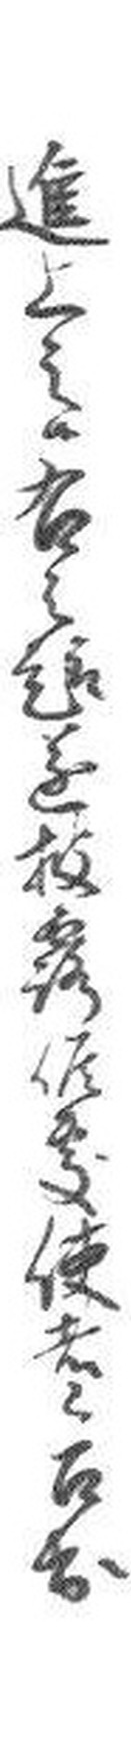進上之候右之趣遂披露候処使者被召出
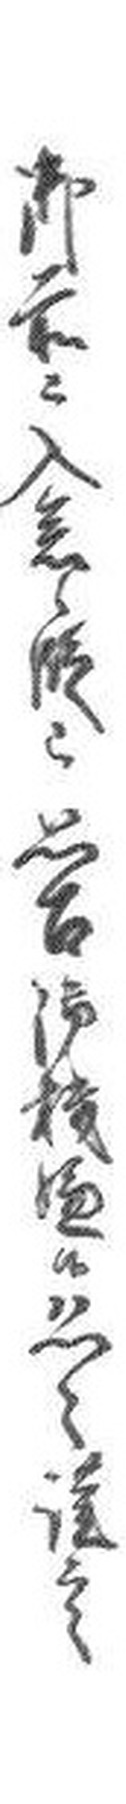御前ニ入念之段被思召御機嫌候恐々謹言
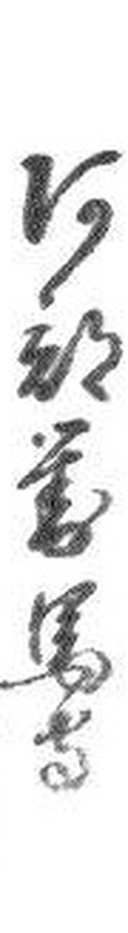阿部対馬守
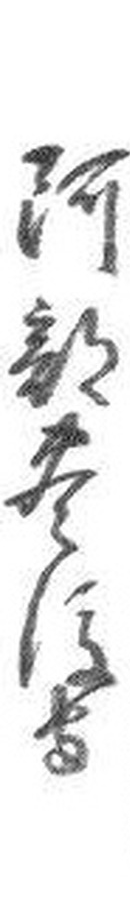阿部豊後守
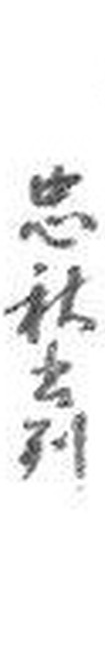忠秋書判
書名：家譜 四 忠昌公 従寛永七年到正保四年
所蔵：福井県文書館 Fukui Prefectural Archives
